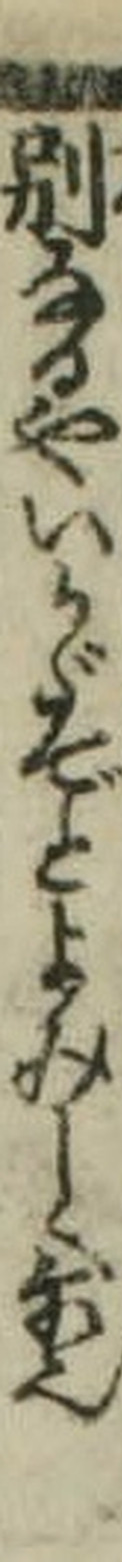別なるやいかがぞとよみし哥也
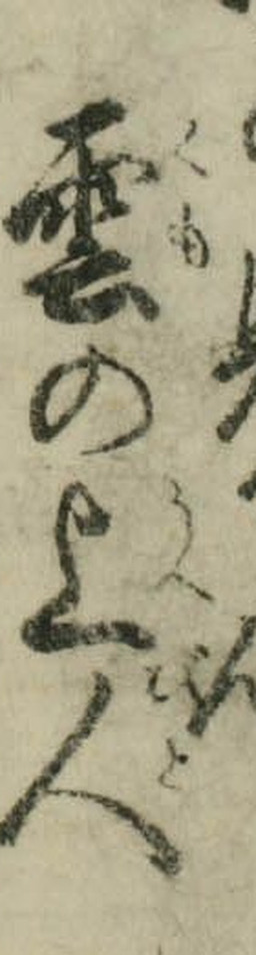雲の上人
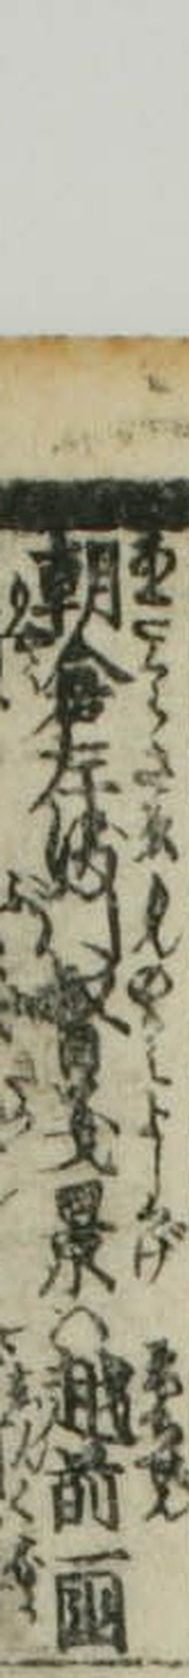朝倉左衛門督義景は越前一国
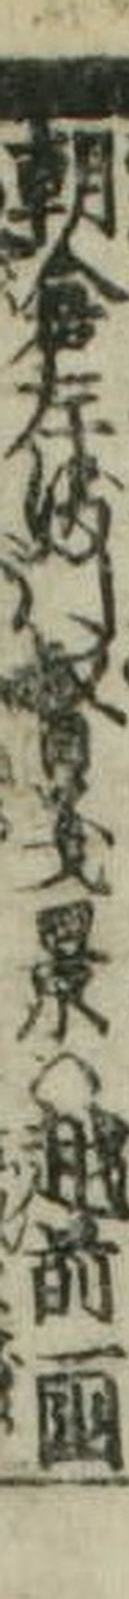朝倉左衛門督義景は越前一国
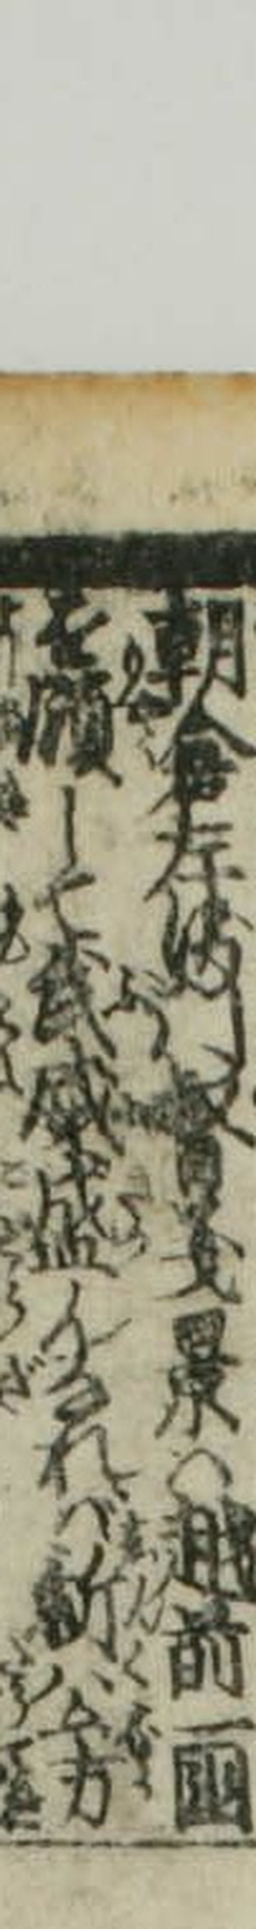を領して武威盛んなれば新公方
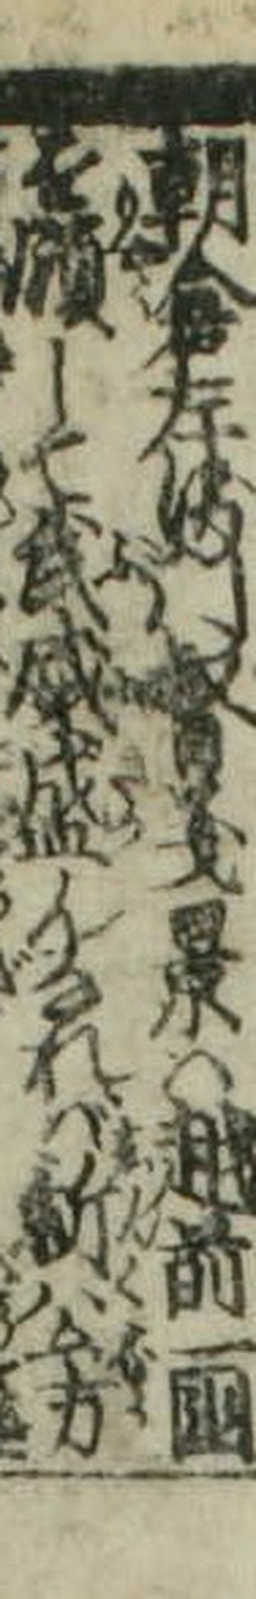を領して武威盛んなれば新公方
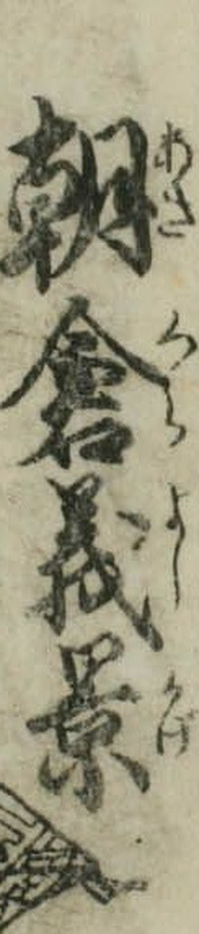朝倉義景
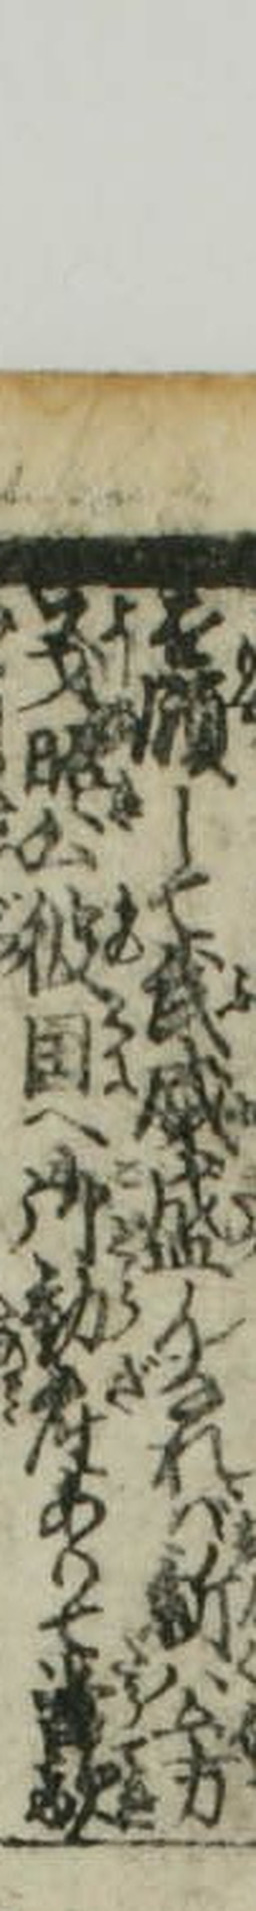義昭公彼国へ御動座ありて当敵
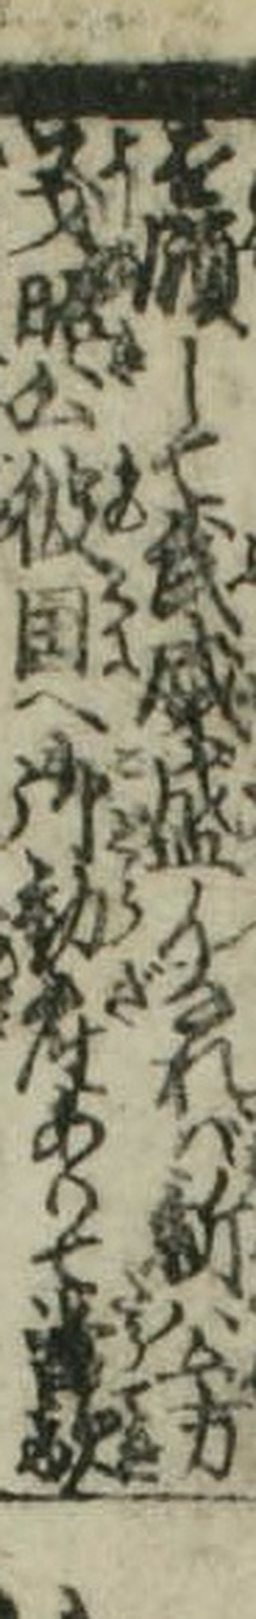義昭公彼国へ御動座ありて当敵
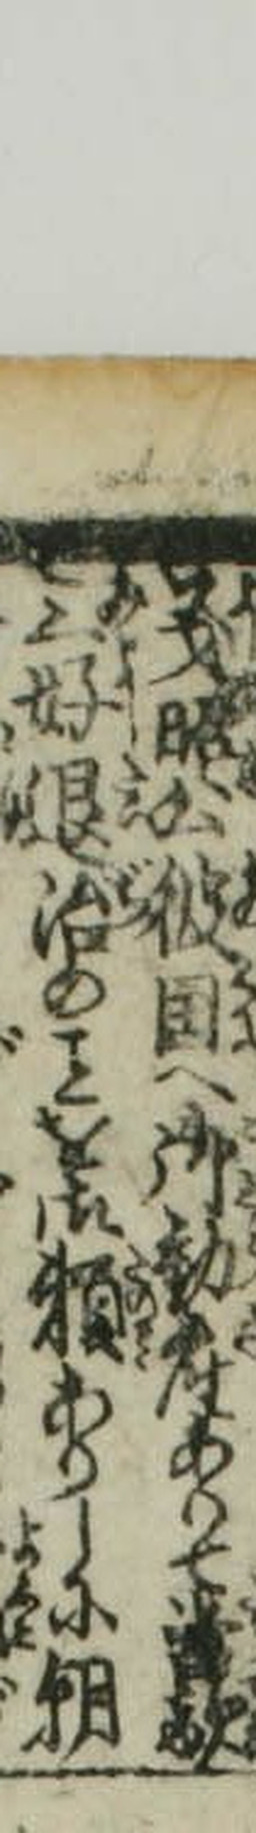三好退治のことを御頼ありしに朝
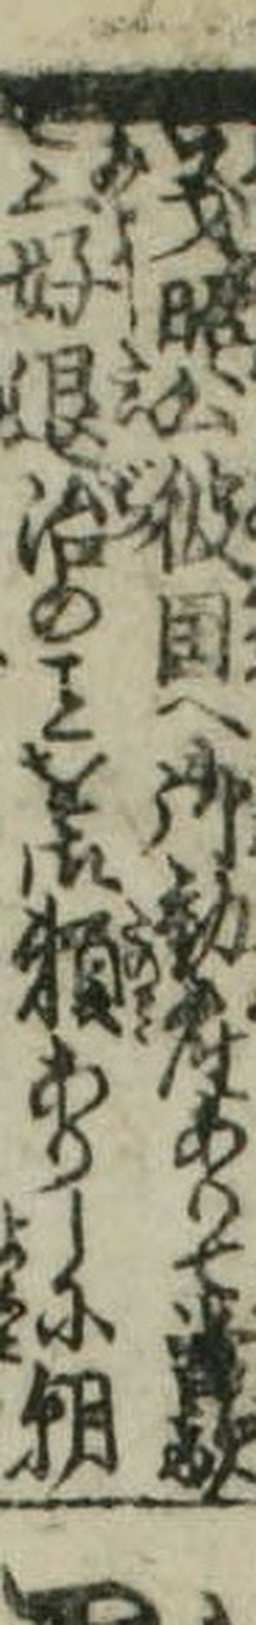三好退治のことを御頼ありしに朝
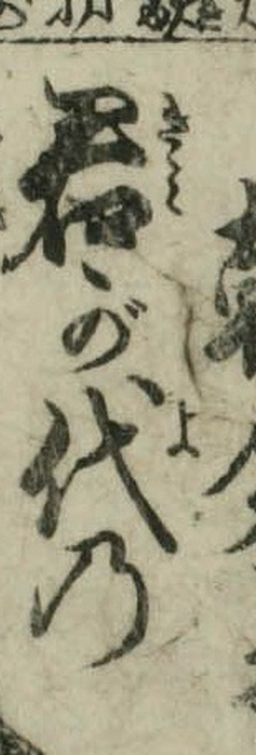君が代の
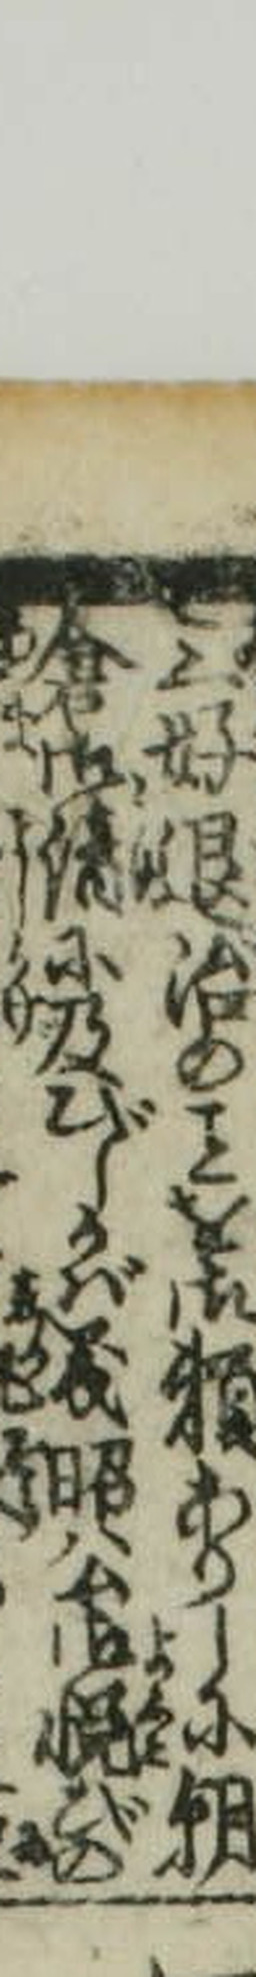倉御請に及びしかば義昭公御悦びの
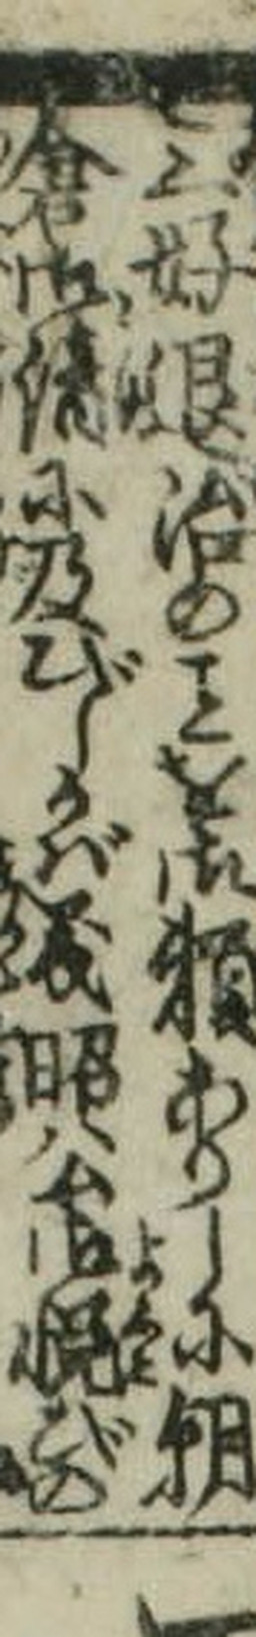倉御請に及びしかば義昭公御悦びの
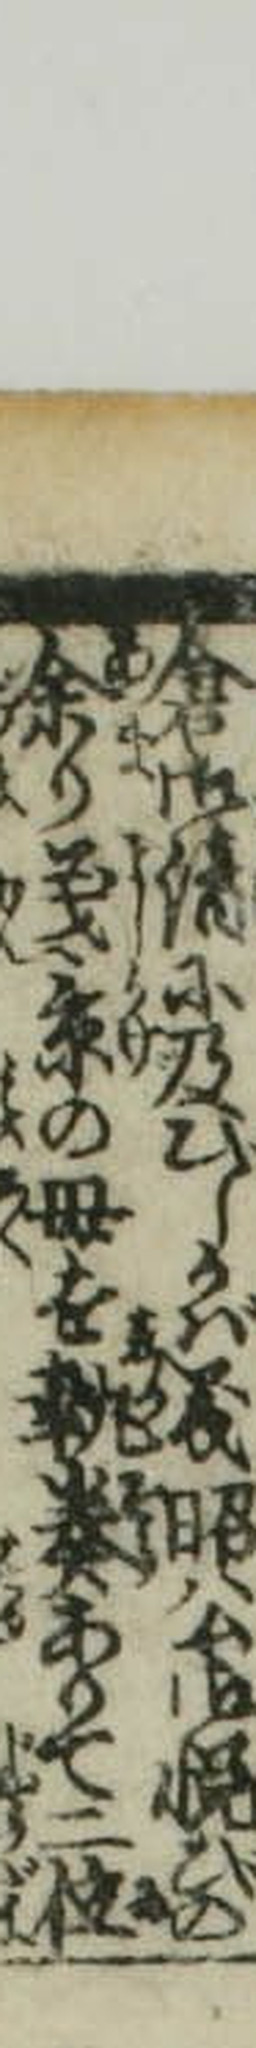余り義景の母を執奏ありて二位
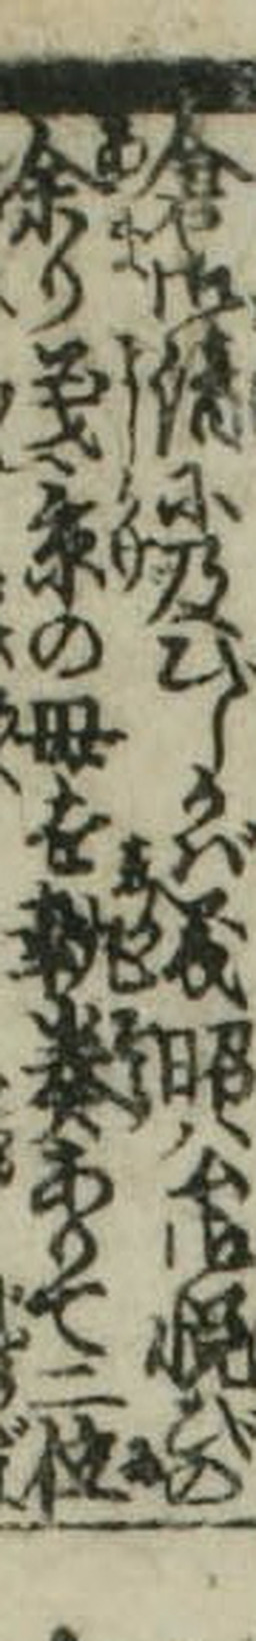余り義景の母を執奏ありて二位
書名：續英雄百人一首
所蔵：東京学芸大学附属図書館
